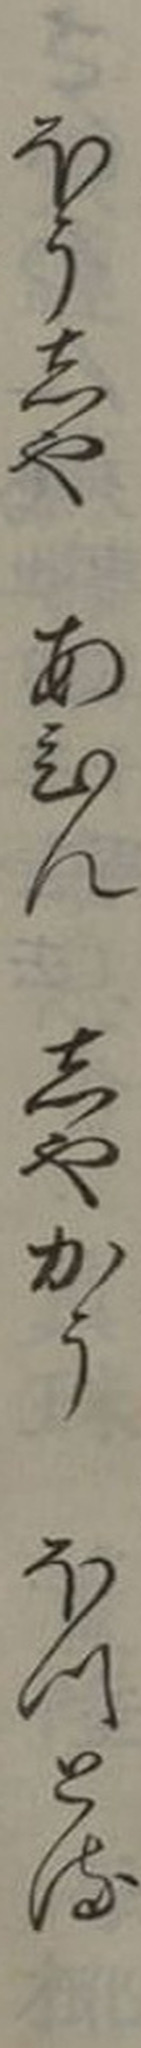ほうしやあひんしやかうほつとる
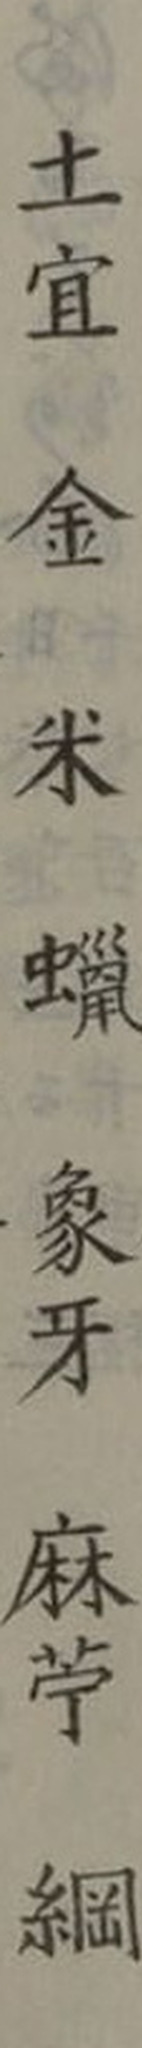土宜金米蠟象牙麻苧綱
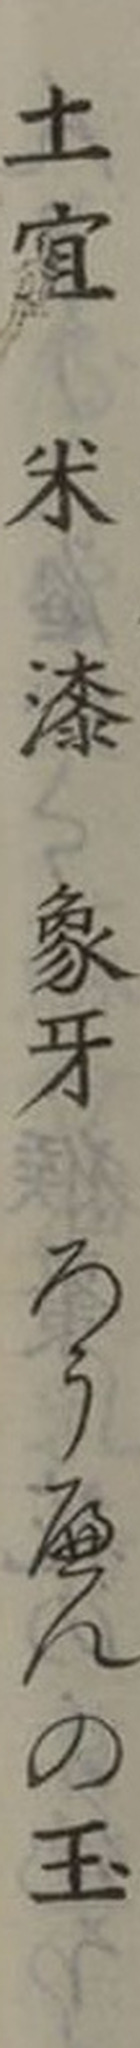土宜金米漆象牙ろうへんの玉
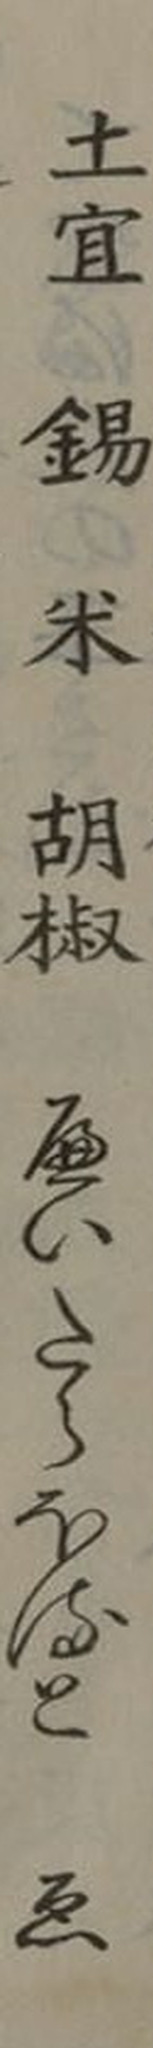土宜錫米胡椒へいたらほるとゑ
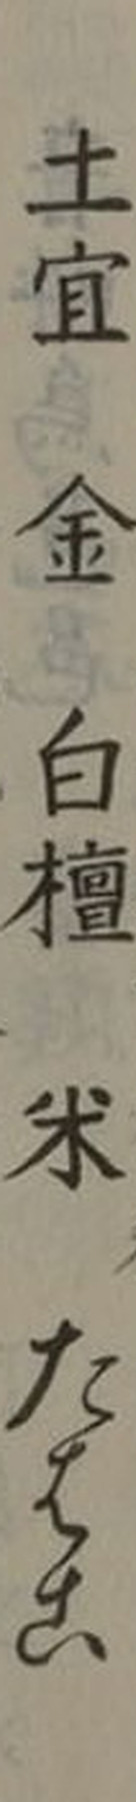土宜金白檀米たはこ
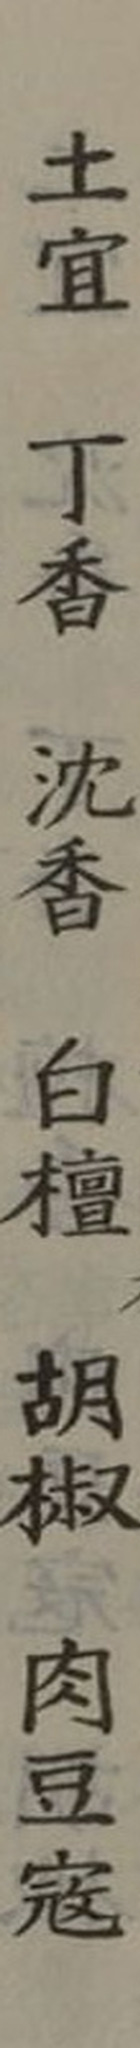土宜丁番沈香白檀胡椒肉豆寇
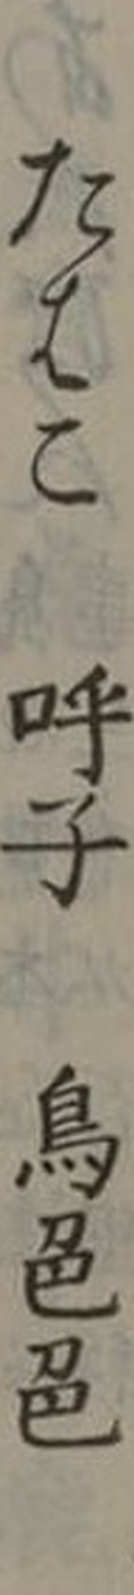たはこ呼子烏色色
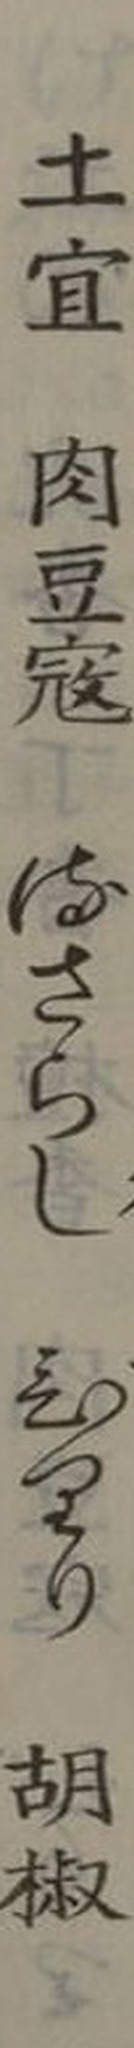土宜肉豆寇るさらしびりり胡椒
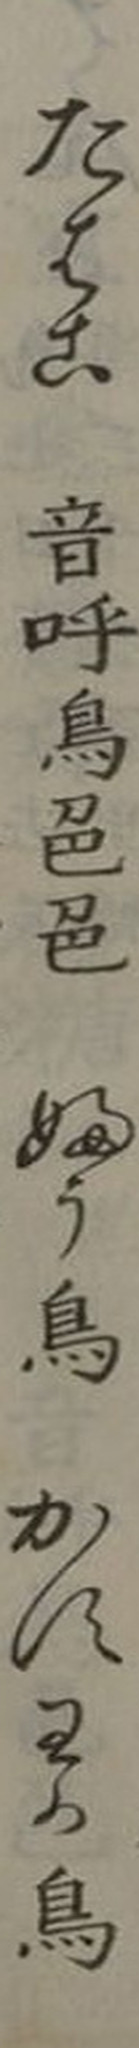たはこ音呼鳥色色ふう鳥かすわか鳥

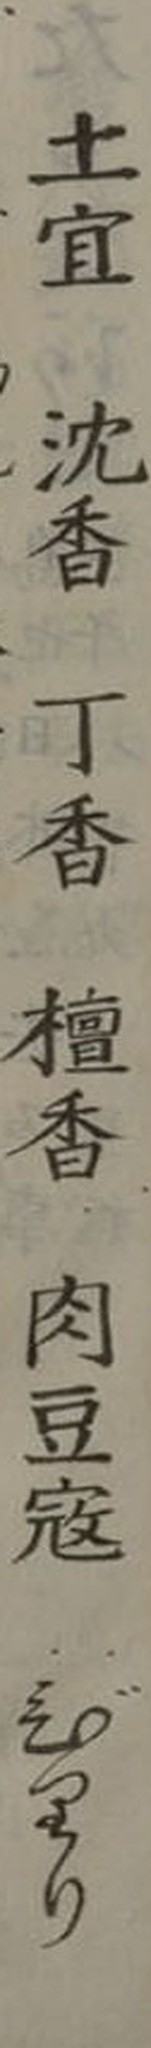土宜沈香丁香檀香肉豆寇びりり
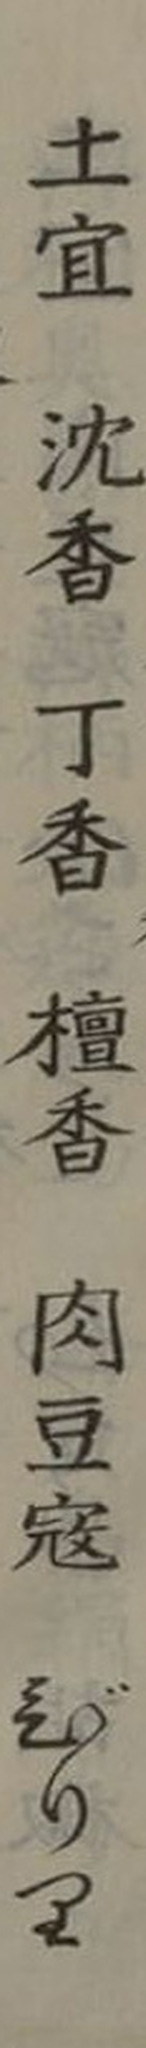土宜沈香丁香檀香肉豆寇びりり
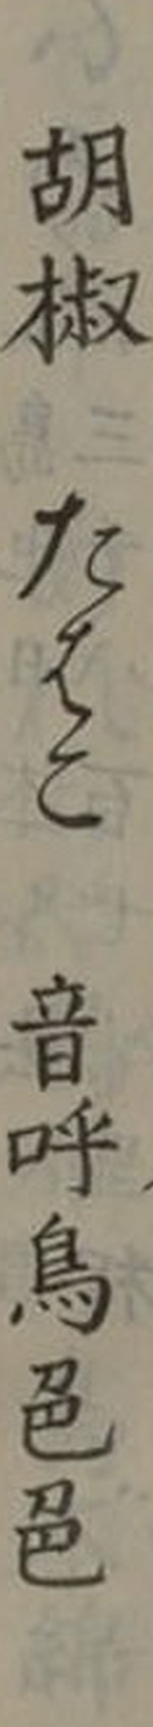胡椒たはこ音呼鳥邑邑
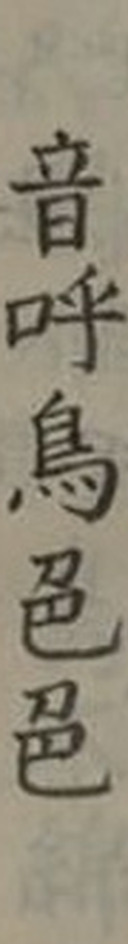音呼鳥色色
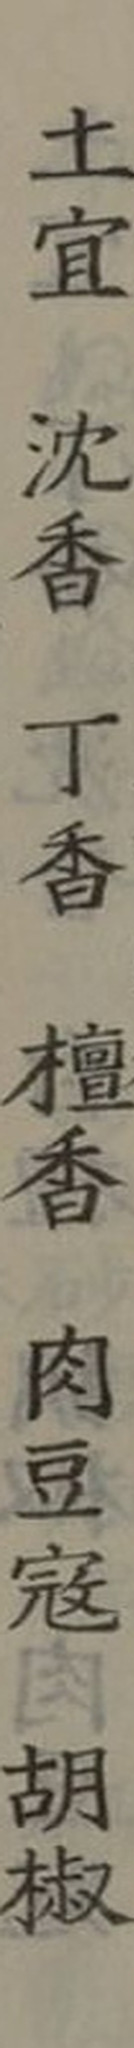土宜沈香丁香檀香肉豆寇胡椒
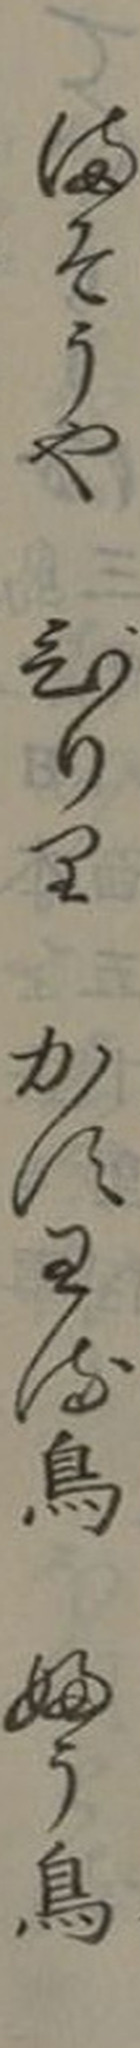まそうやびりりかすわる鳥ふう鳥
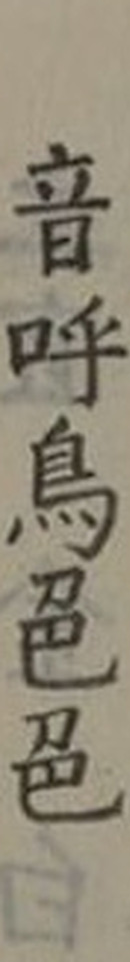音呼鳥色色
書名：骨董録
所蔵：University of the Ryukyus Library
